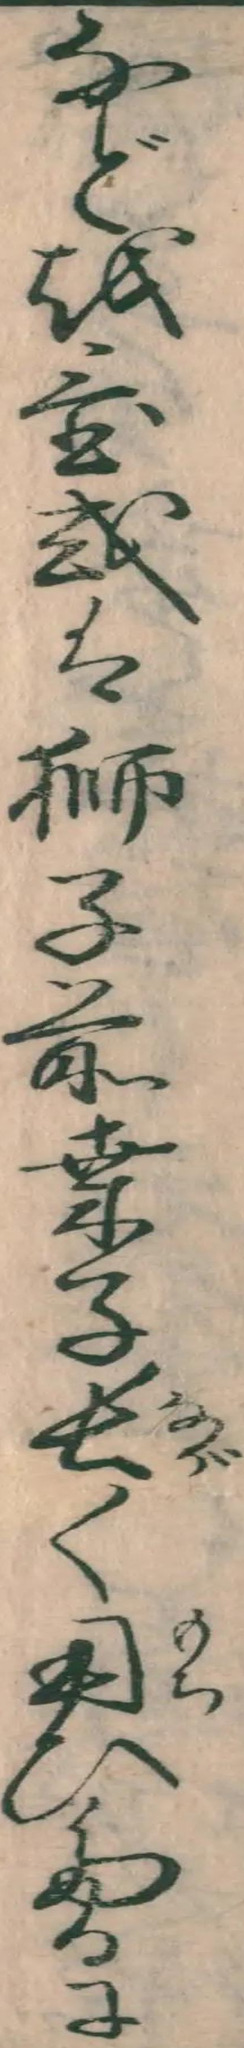などを置或は獅子前桑子長く用ひたるに
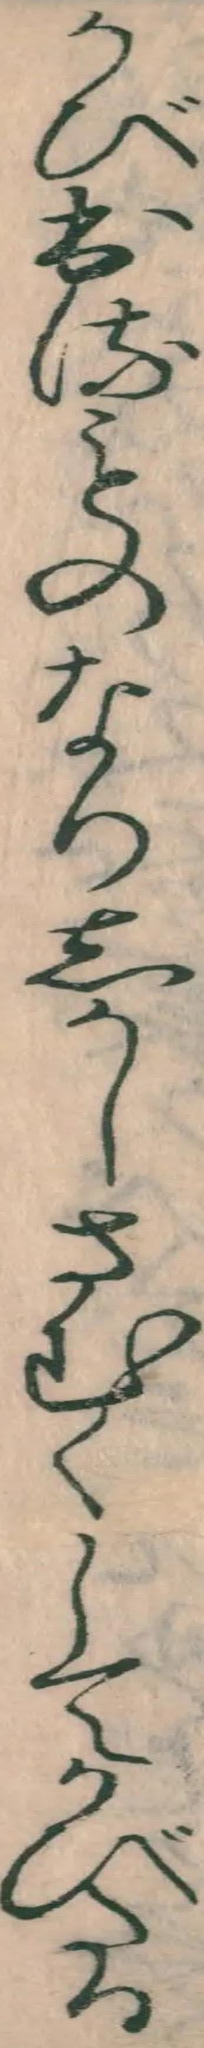かび出るものなりしかしさむくしてかびたる
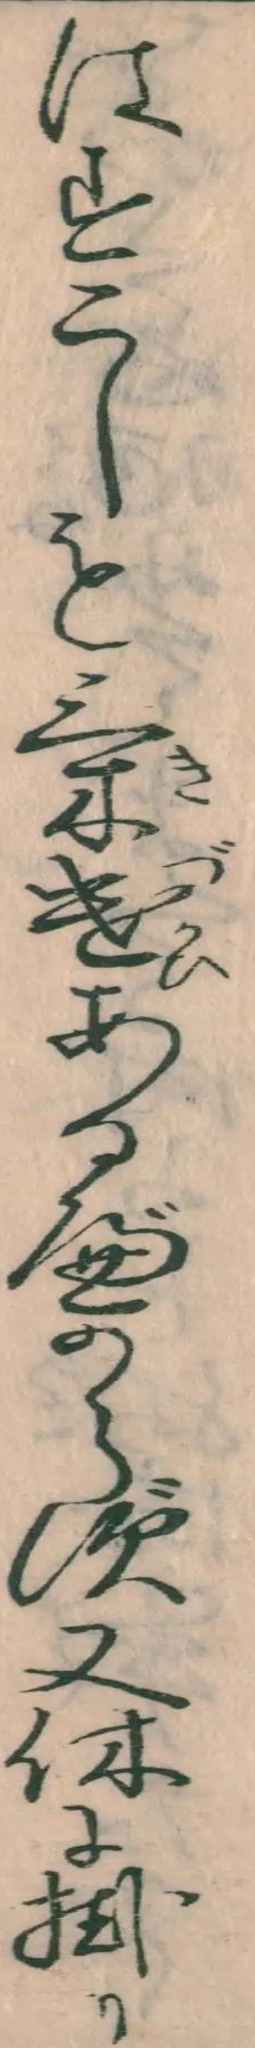はすこしも気遣あるべからず又休に掛り
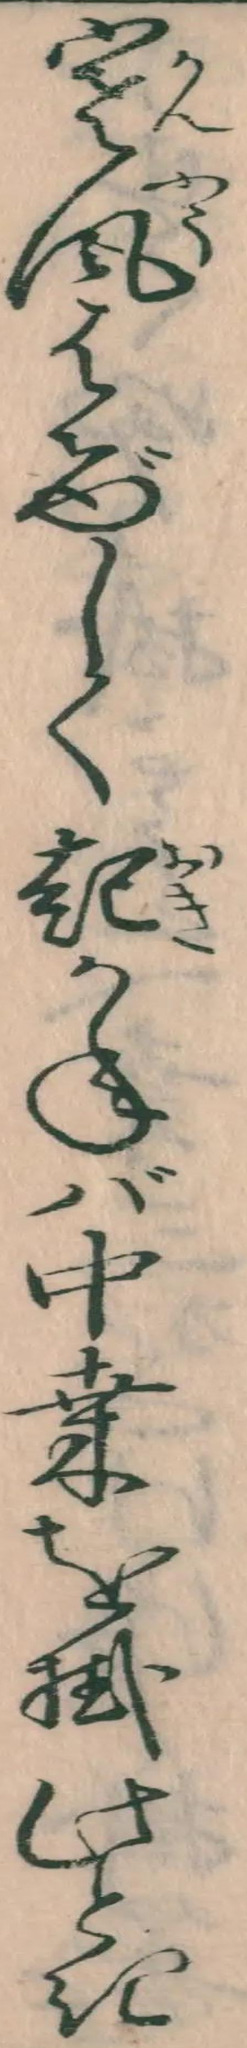寒風はげしく起かねば中桑を掛此とき
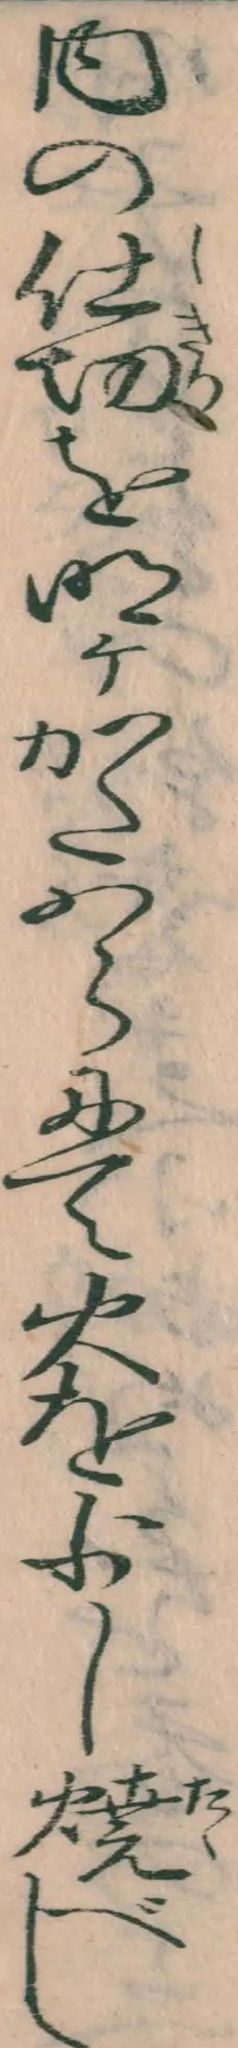内の仕切を明けかたはらにて火を少し焼べし
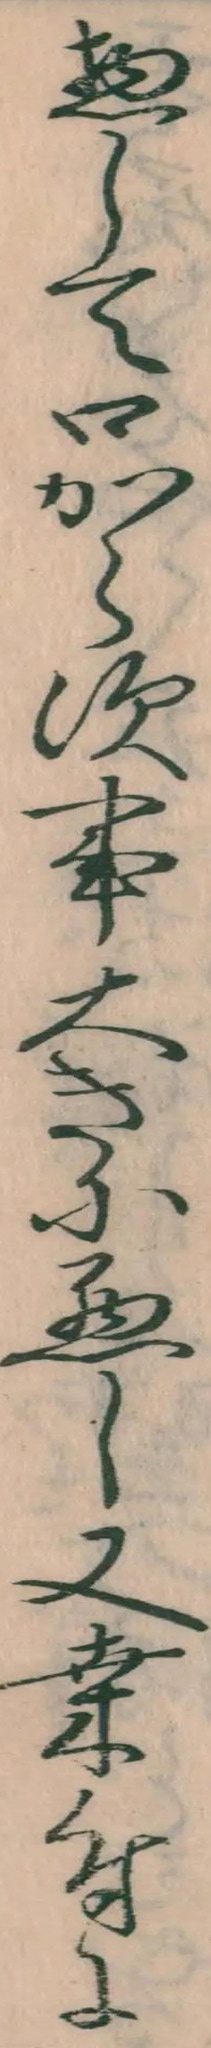惣して口からす事大きに悪し又桑付に
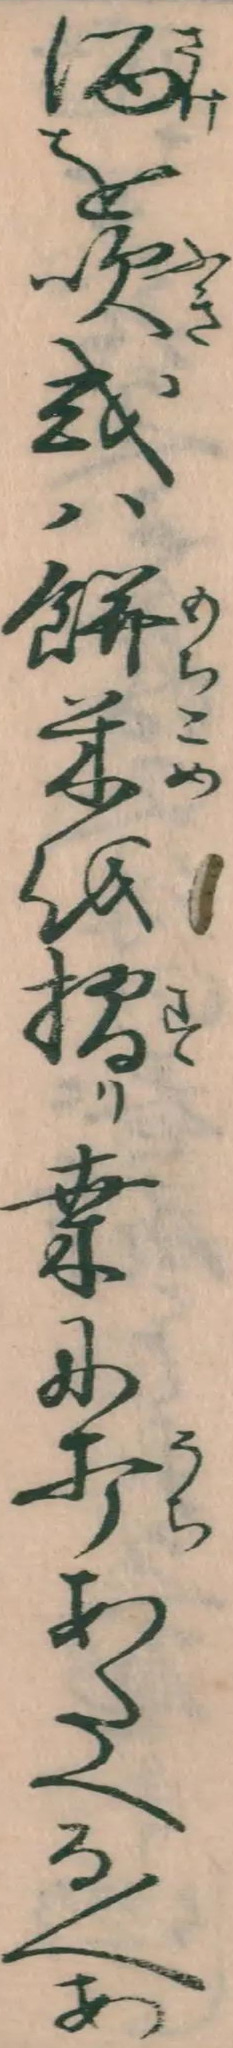酒を吹或は餅米を摺り桑に打あたへる人あ
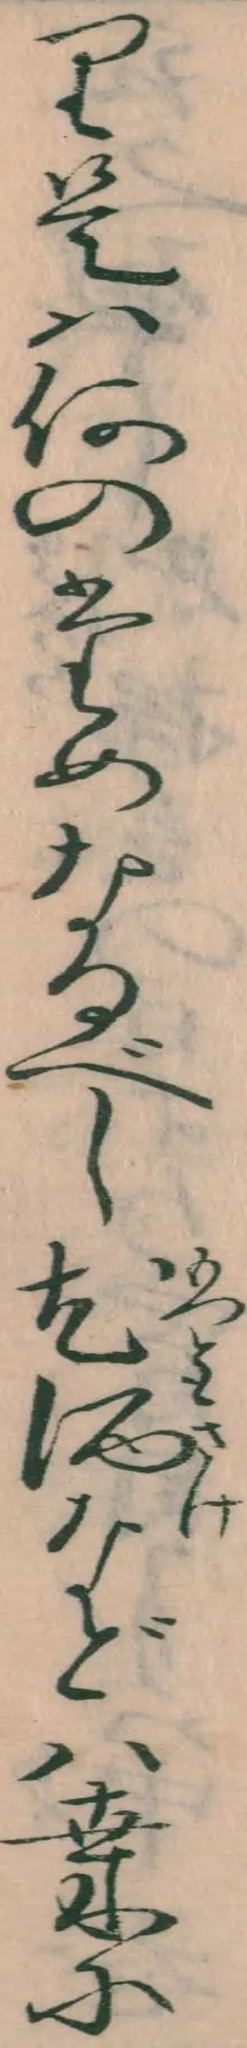り是は何のためなるべし尤酒などは桑に
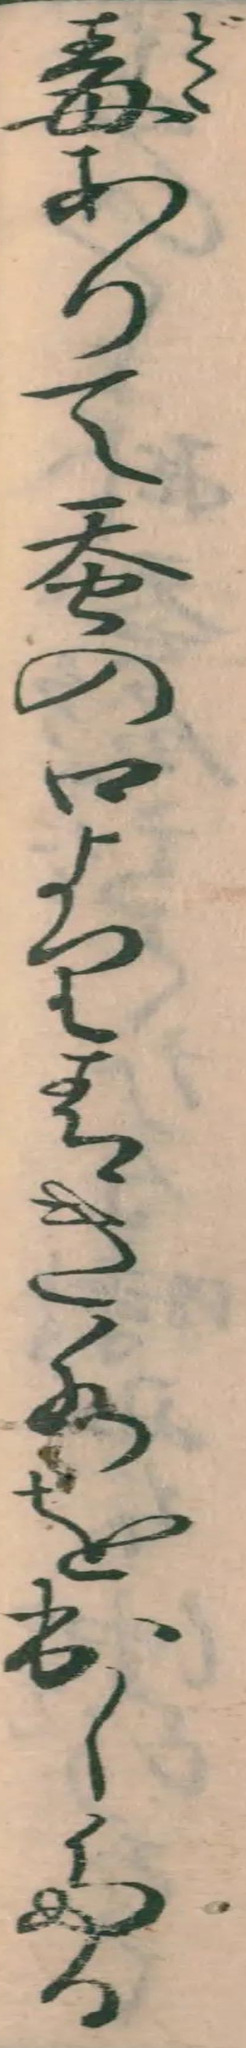毒ありて蚕の口より青き水を出したる
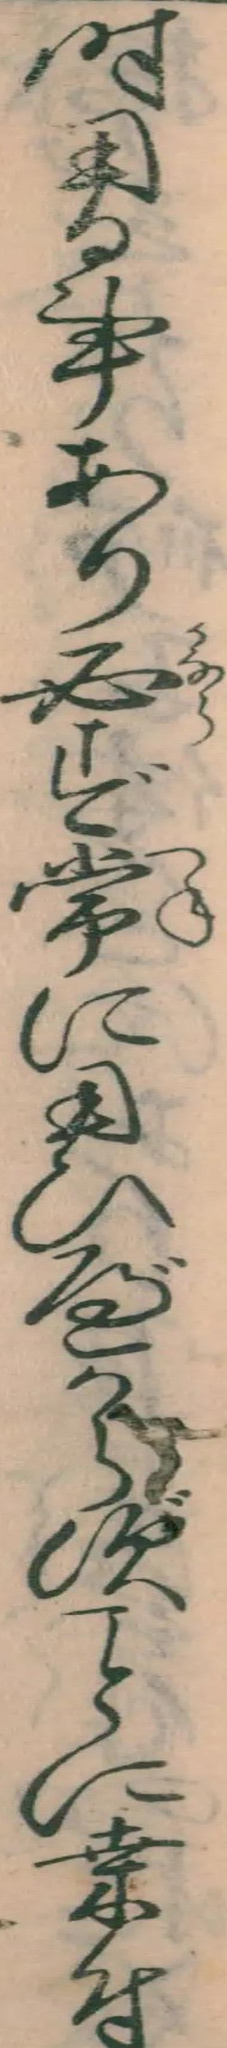時用る事あり必ず常に用ひべからずことに桑付
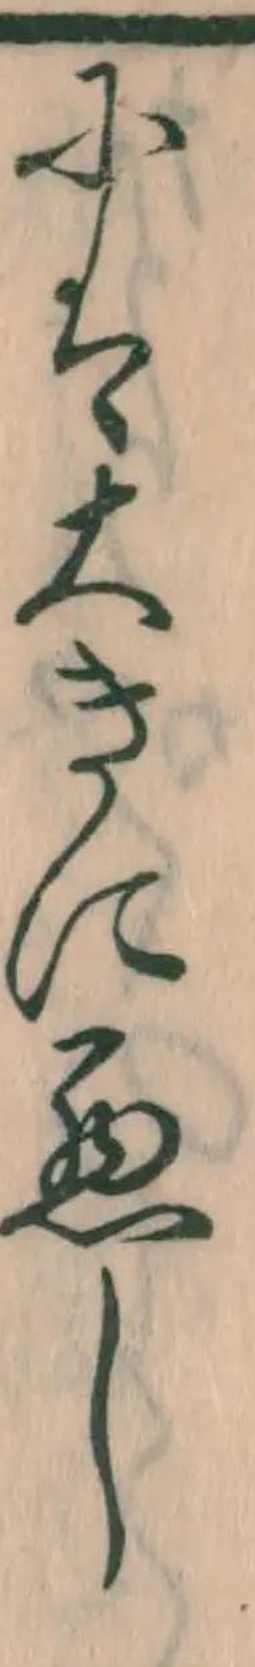には大きに悪し
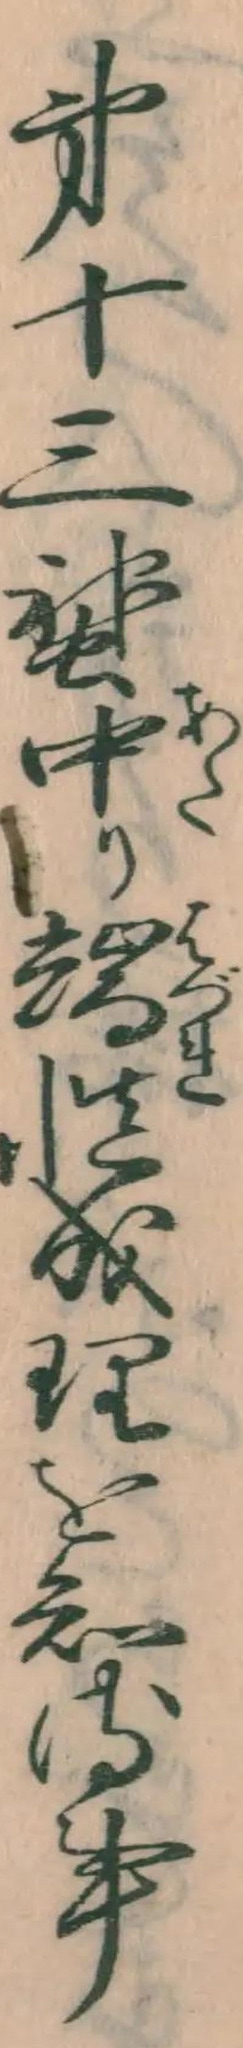第十三䗝中り端慥成りを知る事
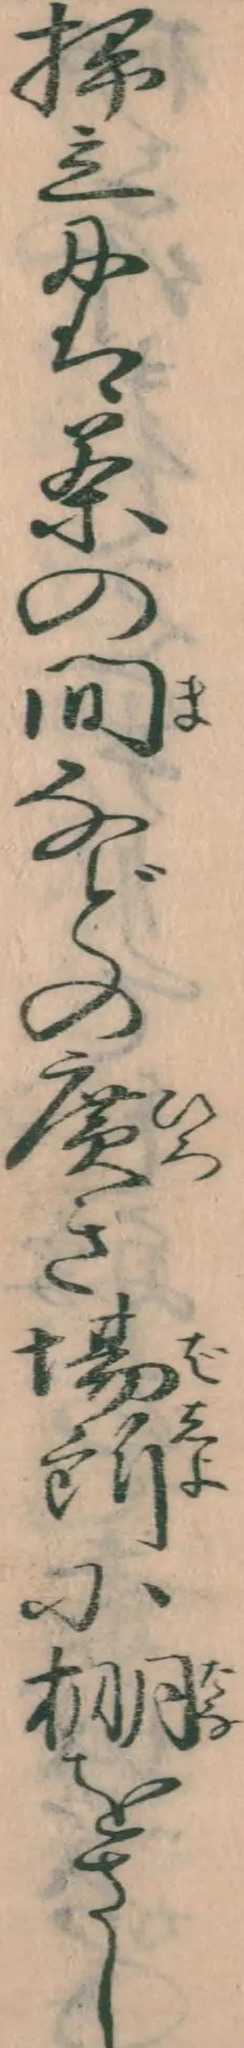掃立には茶の間などの広き場所に棚をさし
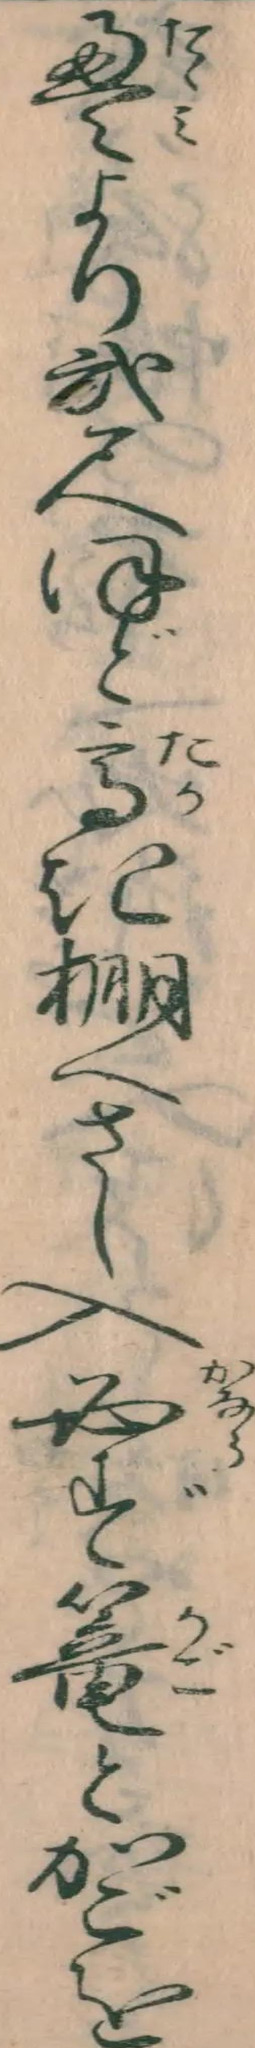畳より弐尺ほど高き棚へさし入必ず篭とかごを
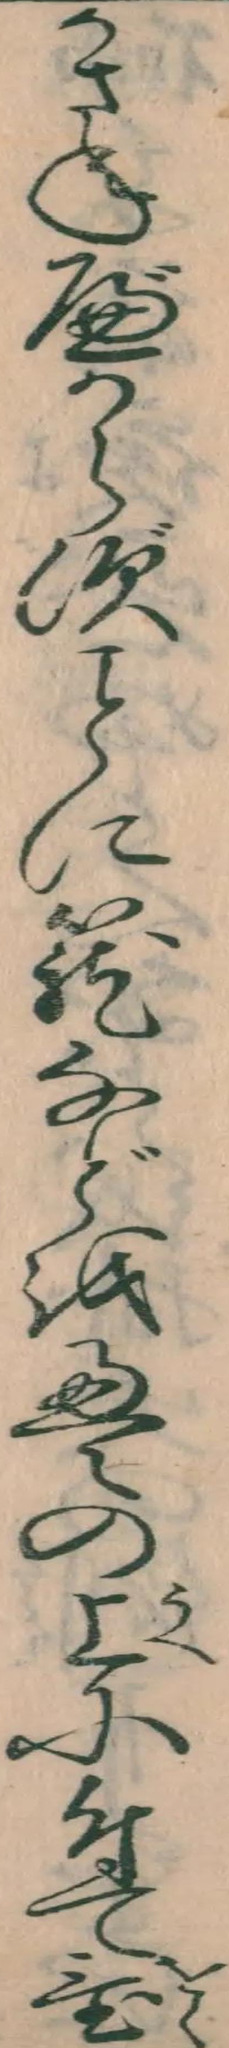かさねべからずことに籠などを畳の上に付て置
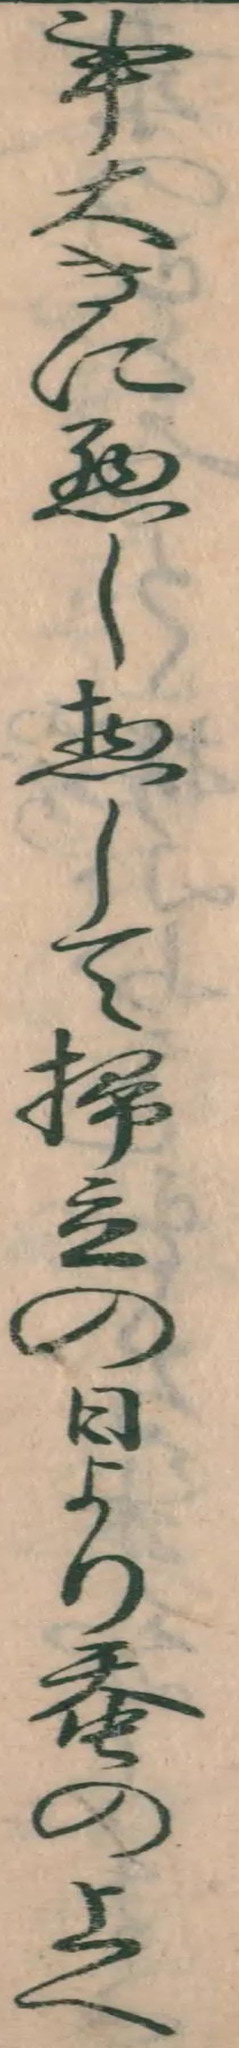事大きに悪し惣して掃立の日より蚕の上へ
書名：新撰養蚕秘書
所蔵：国立国会図書館 National Diet Library, JAPAN
